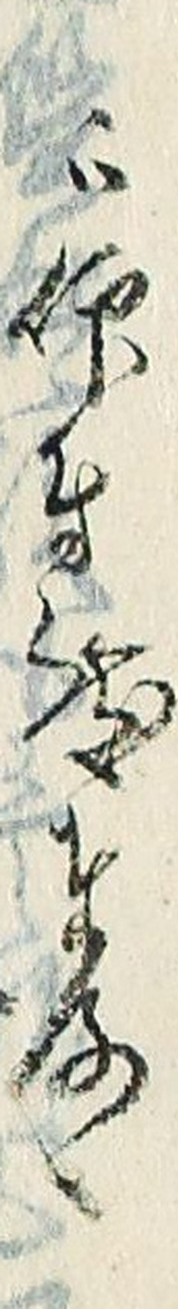被仰付度奉存候
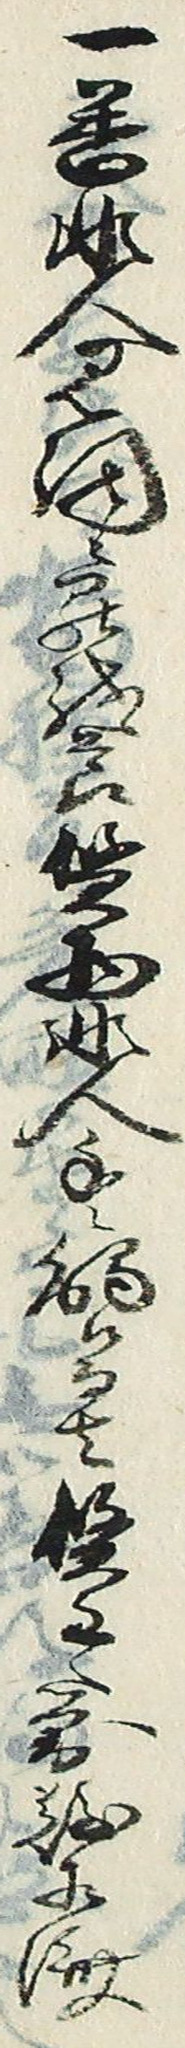一番非人見調ニ罷越候節質物非人手ニ觸候而者質主へ對難相済
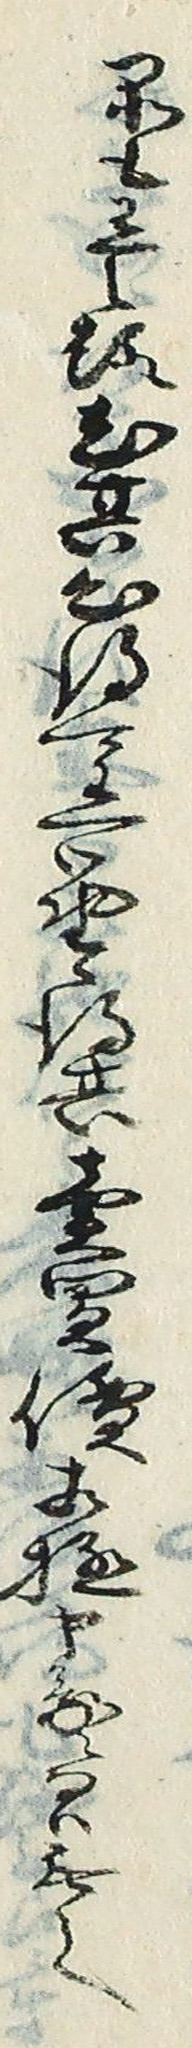品も有之趣尤其心得可有御坐候得共賣買價相極申義ニ而ハ無之
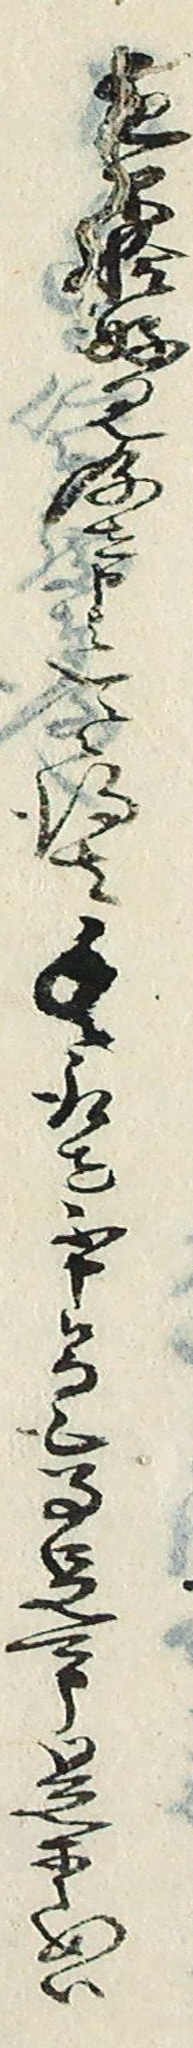色品恰好見及せ申迄ニ候得者手ニ取せ不申候而も事足可申是等之義ハ
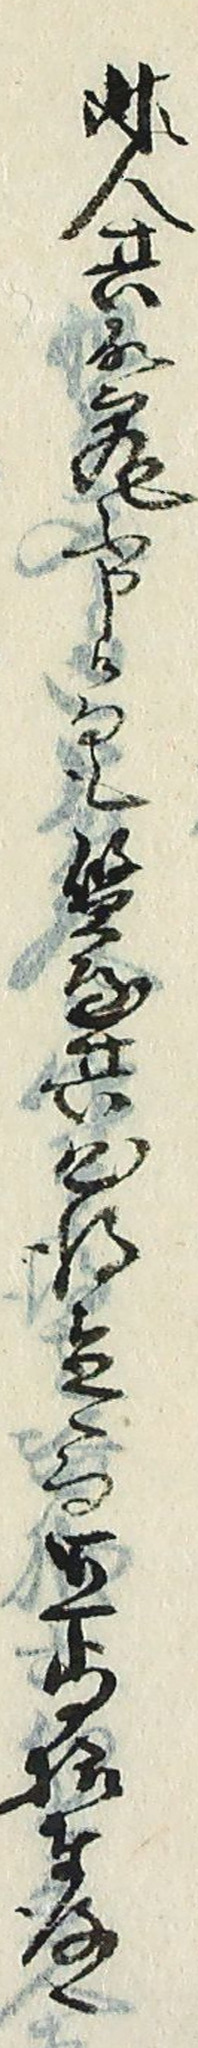非人共取究不申候而も質屋共心得置候而宜布様奉存候
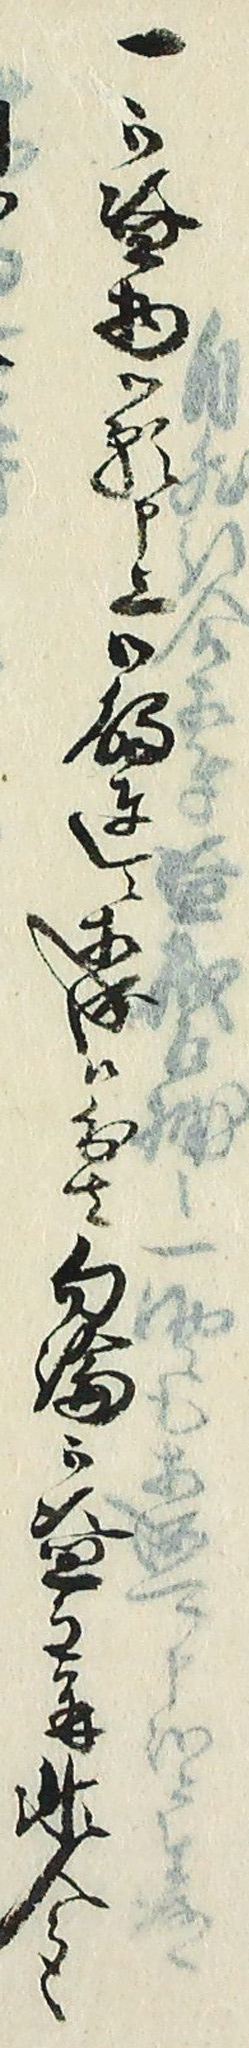一被盗物御願申上御觸達ニ相成候分者勿論被盗主幷非人とも
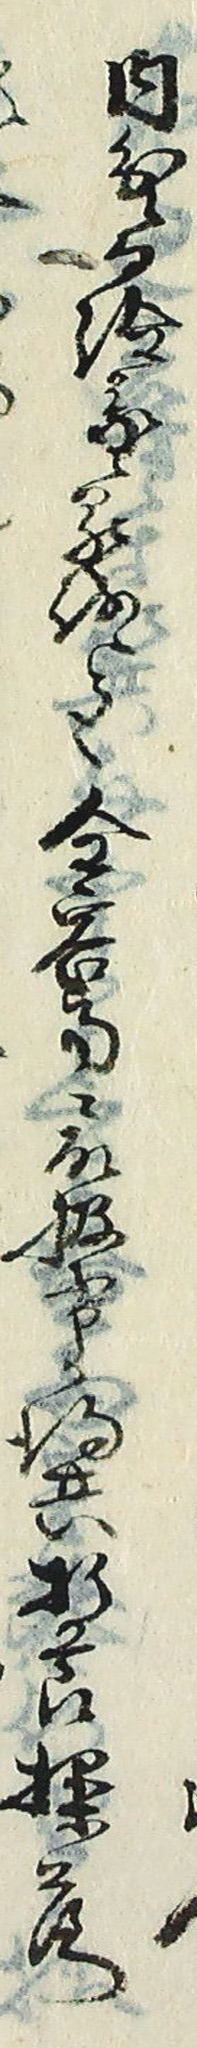内分ニ而詮義ニ罷越候とも全容易ニ取扱不申候得共折節操落
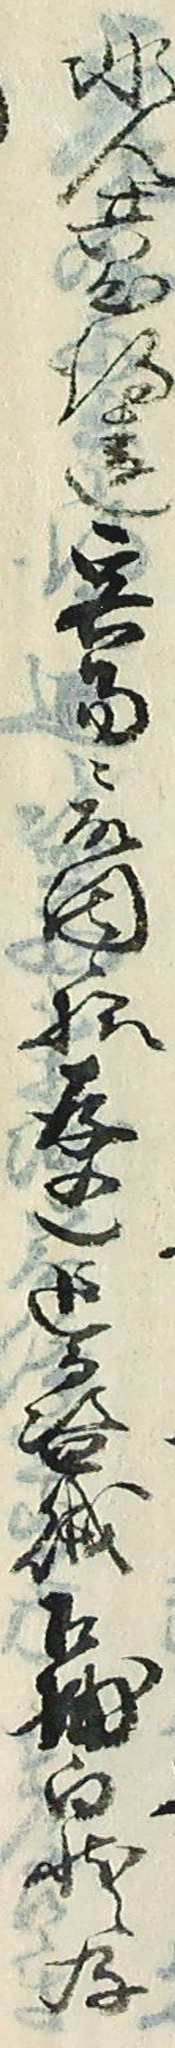非人共心得違容易ニ取調候様存込追而盗賊召捕白状ニ及
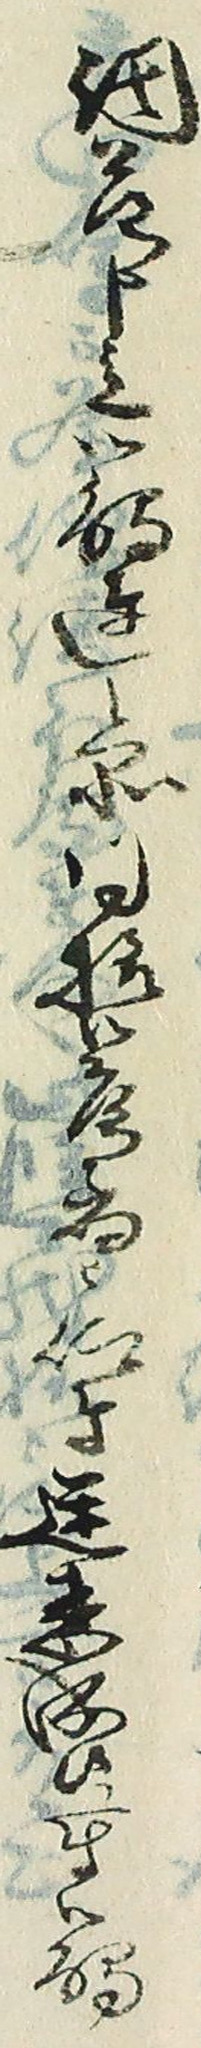調落申立御觸達之品同様御落着被仰付迷惑成候ニ付御觸
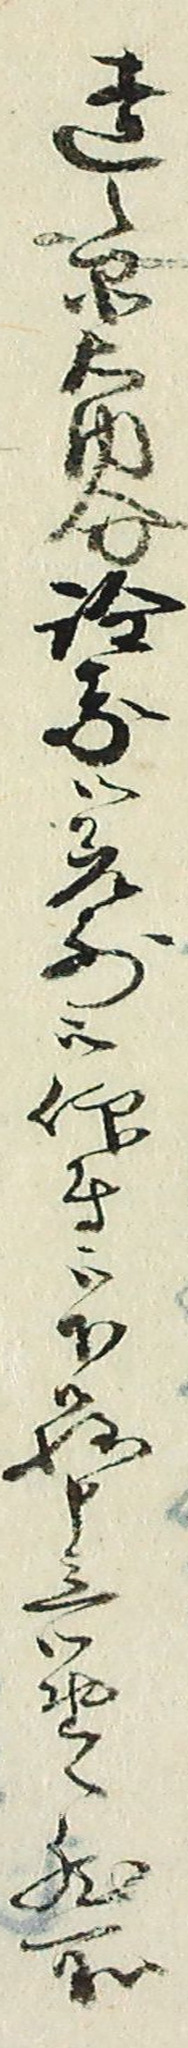達之品右内分詮義御着前被仰付被下候様申立御坐候然所
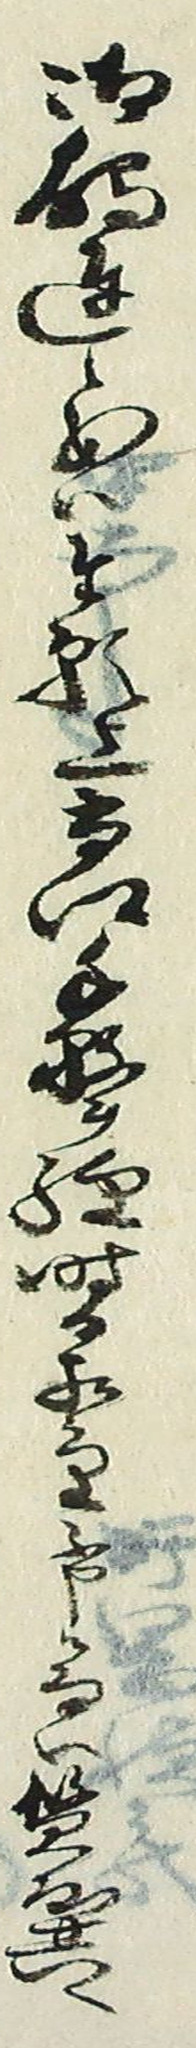御觸達之義ハ奉願上市郷手数ヲ経時日相重不申候而ハ質屋共へ
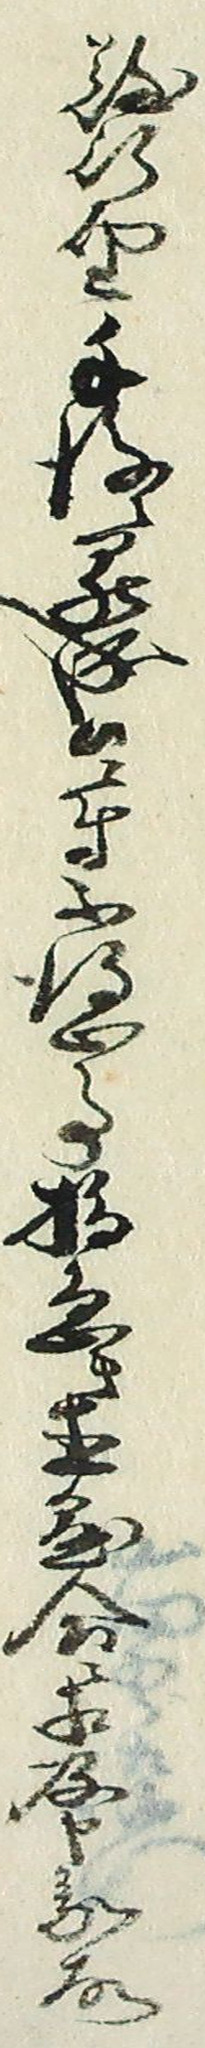難行届手後ニ罷成候ニ付不得止事指急キ直懸合ニ相及申義故
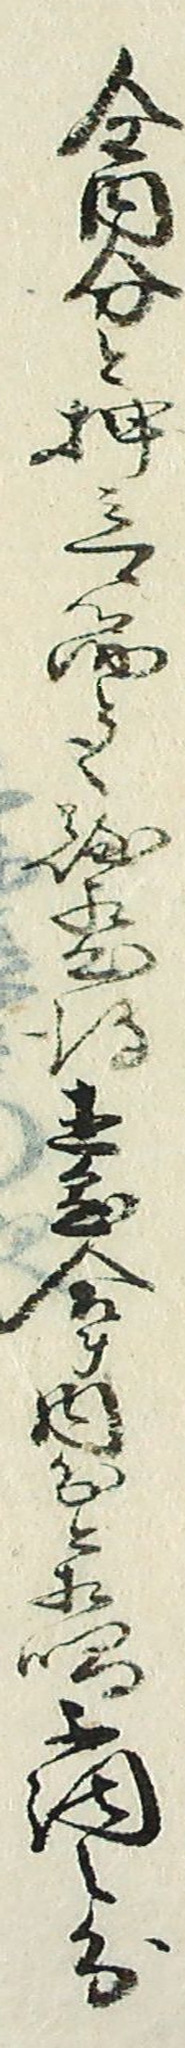全内分と押立候筋とも難相心得直懸合ヲ内分と相唱不調之分
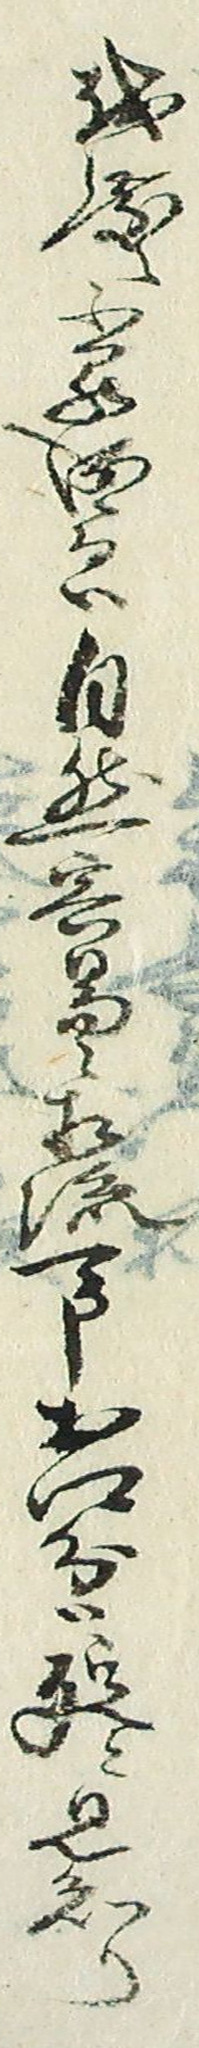越度ニ不罷成候而ハ自然容易ニ相流可申於郷分ハ聢と見知り
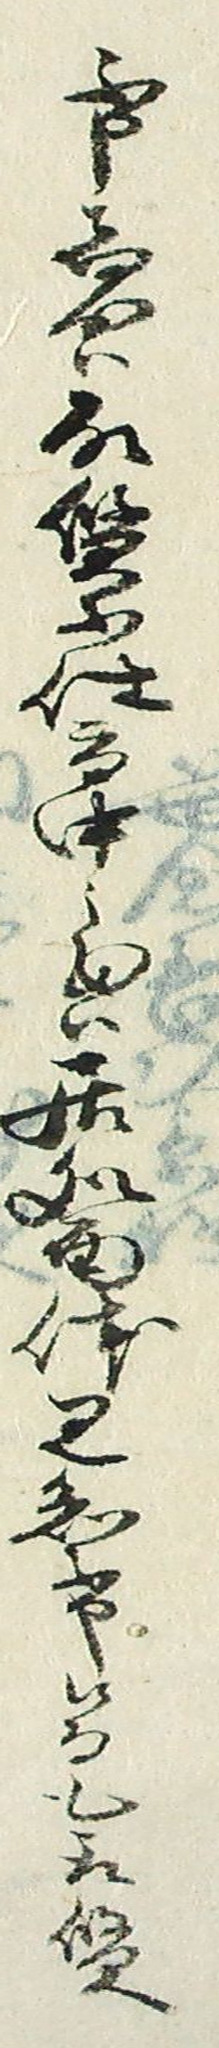不申者ゟハ取質不仕市中之義ハ居処面体見知不申候而も取質
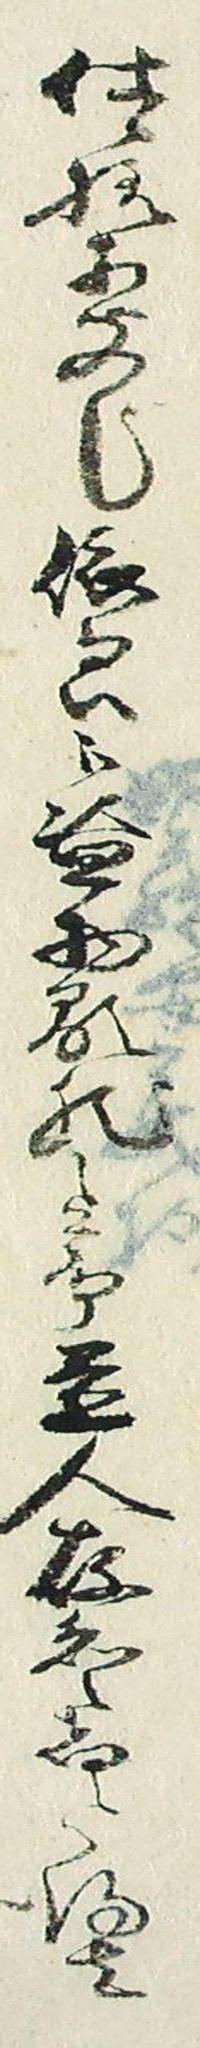仕候様相聞申候依而ハ被盗物顕然之節置人存知之者ニ候得者
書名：市郷質屋株御取究並御書出御趣法之写
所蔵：鳴門教育大学 Naruto University of Education
